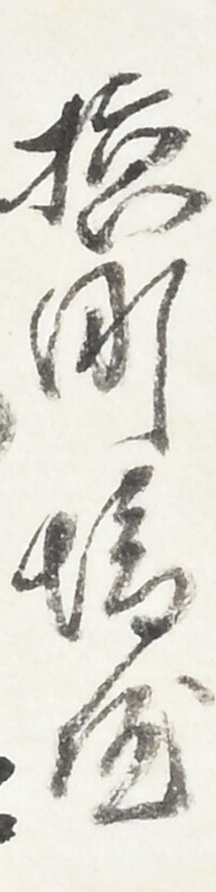横町塩屋
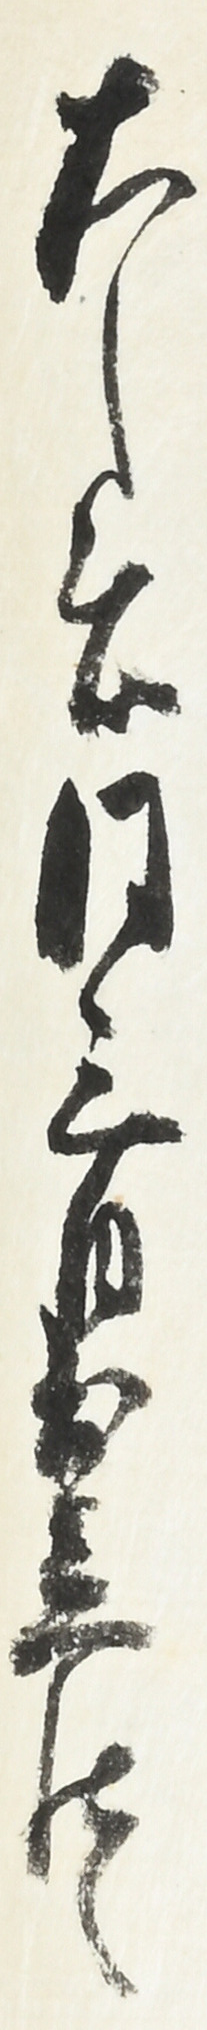右之者同三日出立仕候
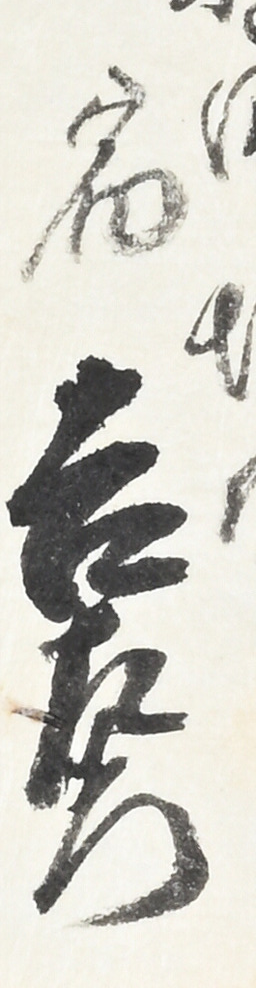宿吉左衛門
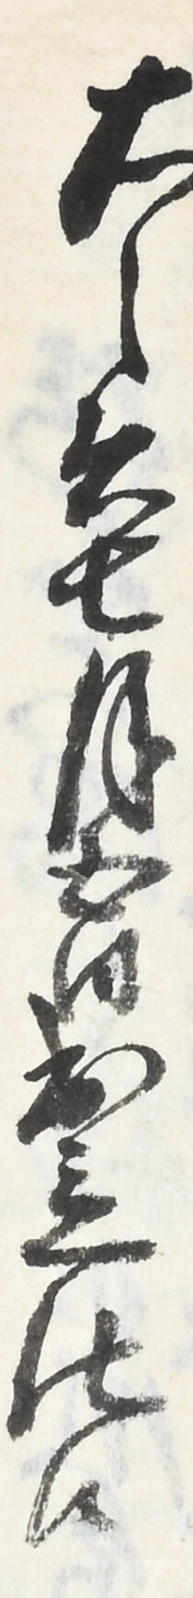右之者同六日出立仕候

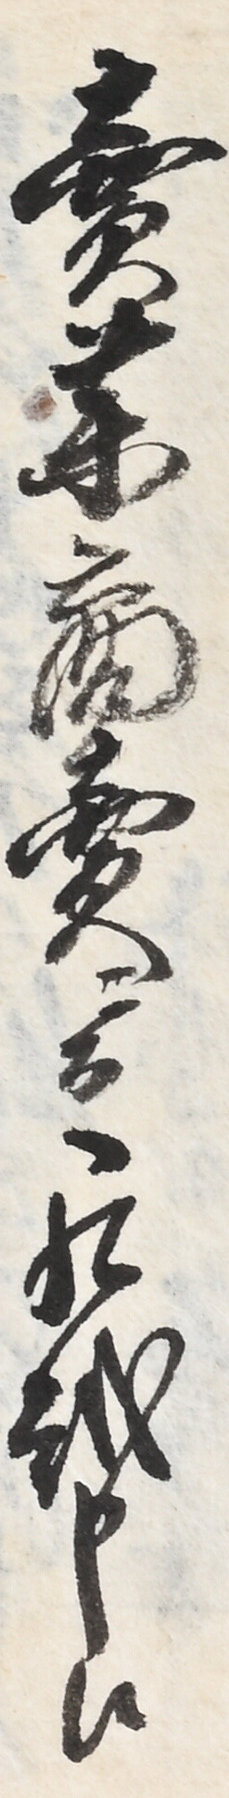小間物商売ニ而罷越申候
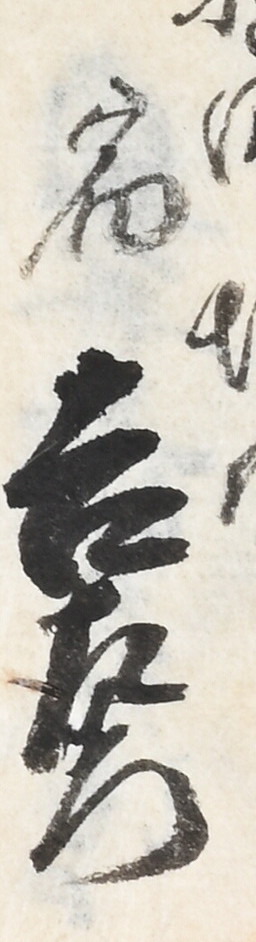宿清左衛門
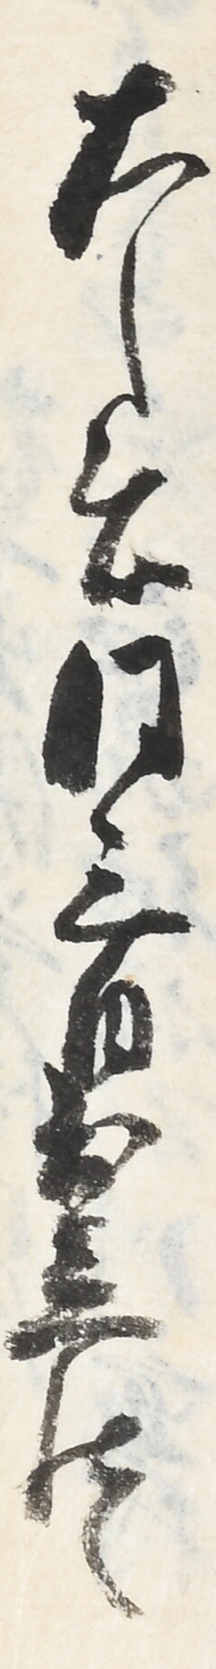右之者七月五日出立仕候
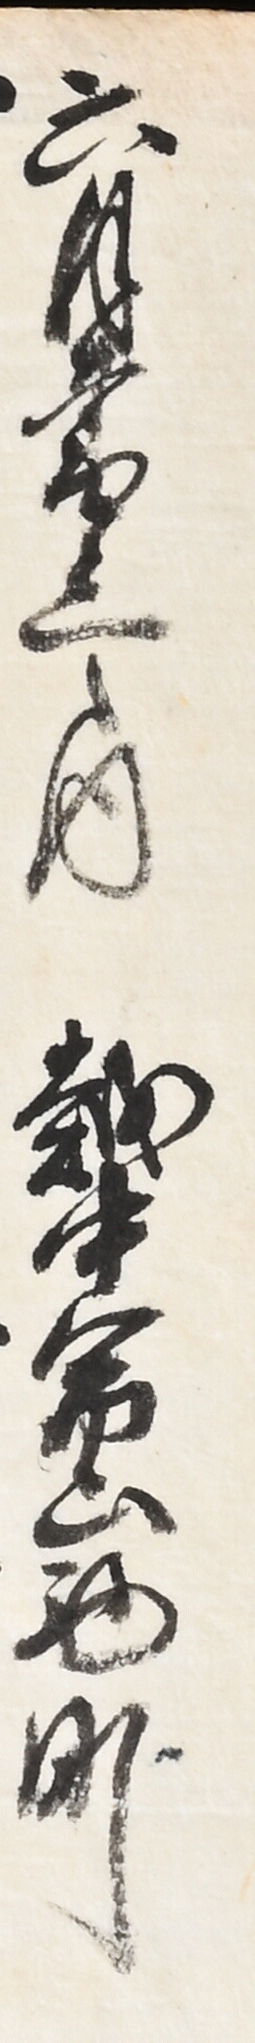六月書上之内越中富山西町
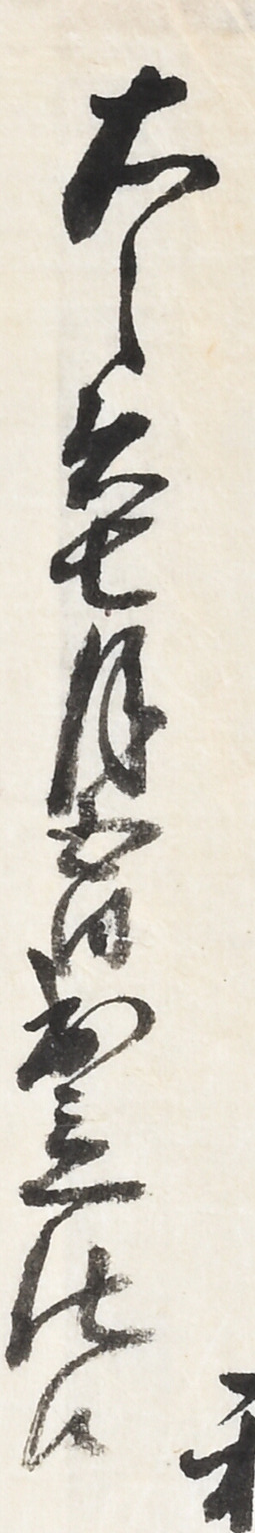右之者七月五日出立仕候
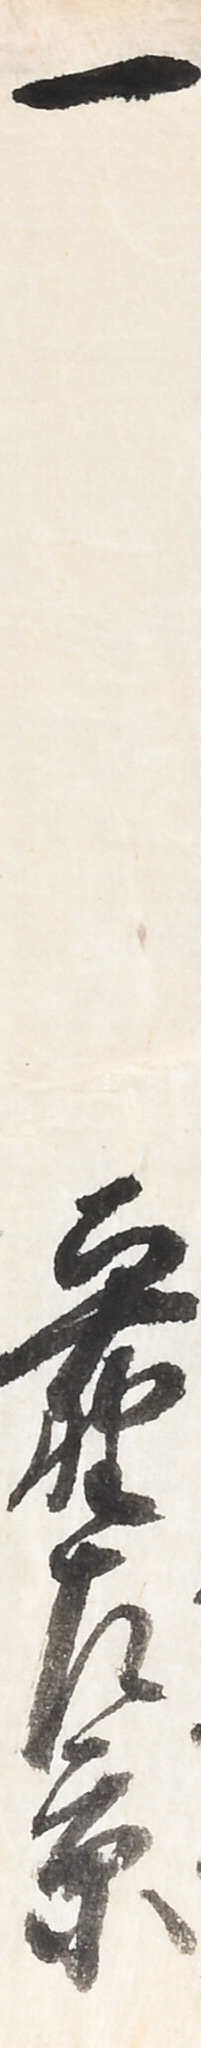一平野左京
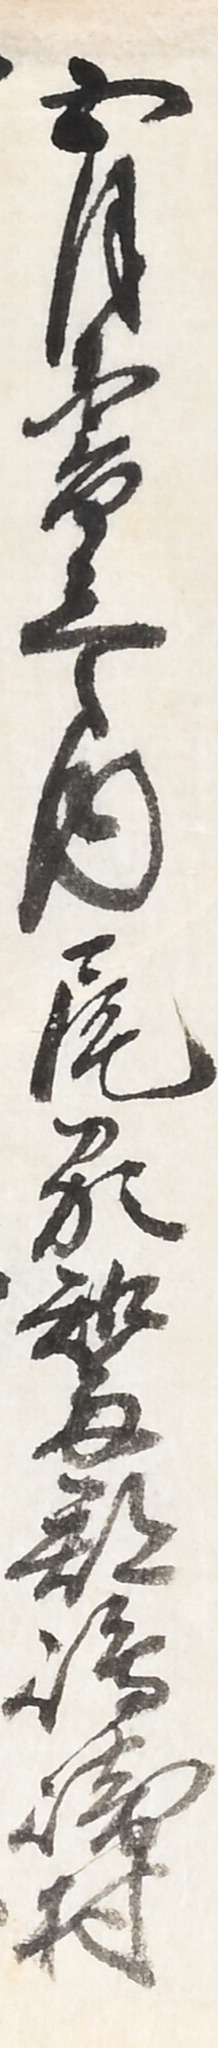五月書上之内尾州知多郡嶋崎村
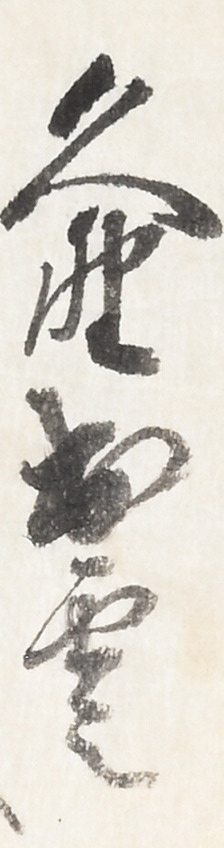久野出雲
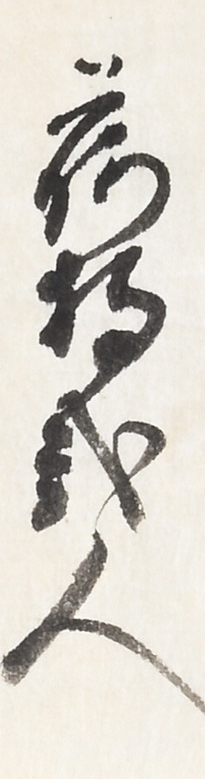荷持弐人
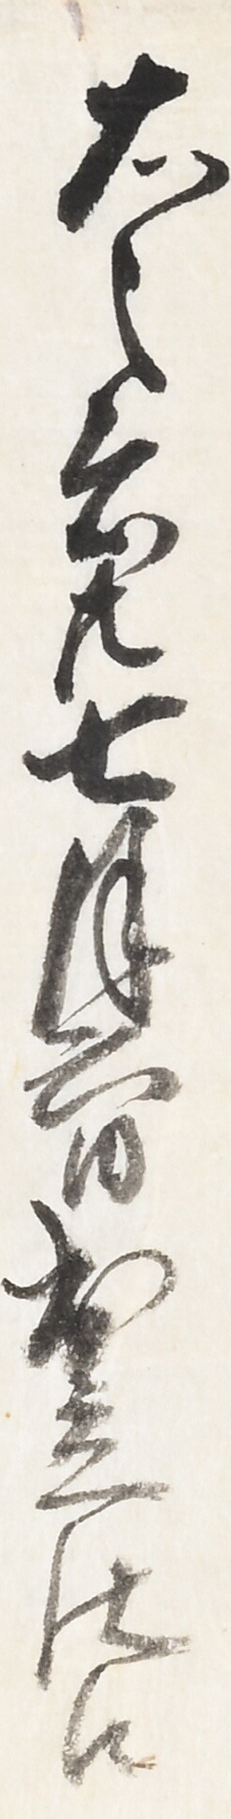右之者共七月六日出立仕候
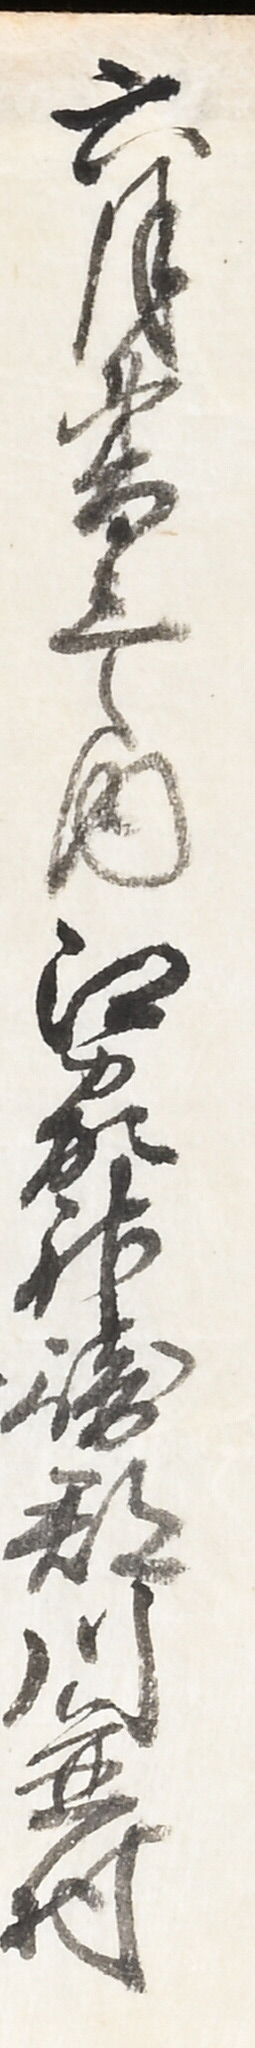六月書上之内江州神嶋郡川並村
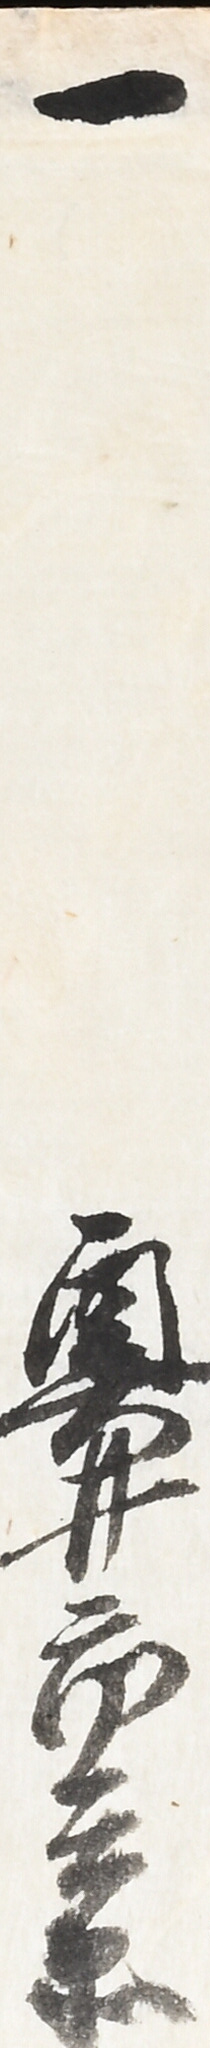奥井市兵衛
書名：旅人泊控帳
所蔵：伊那市立高遠町図書館・合同会社AMANE
